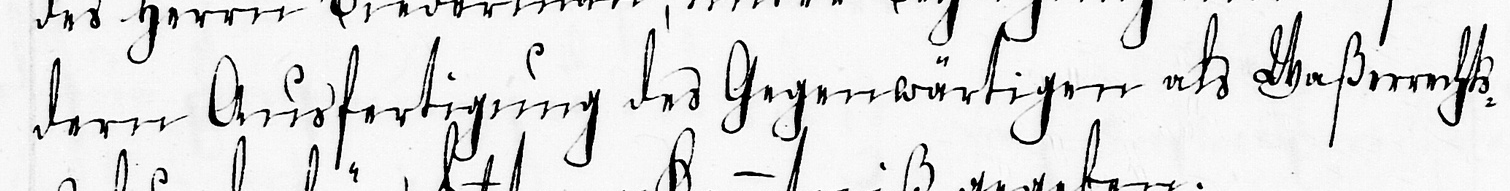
deren Ausfertigung des Gegenwärtigen als Waßerrecht¬
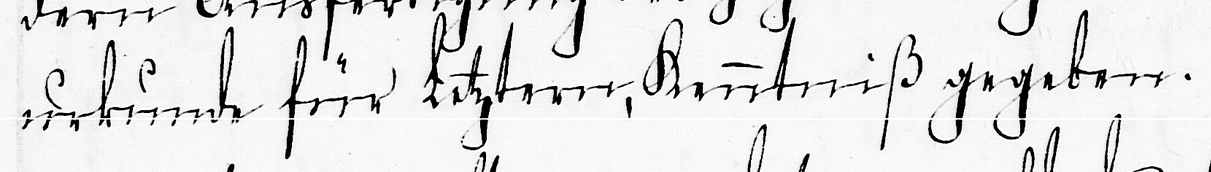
surkunde für Letztern, Kenntniß gegeben.
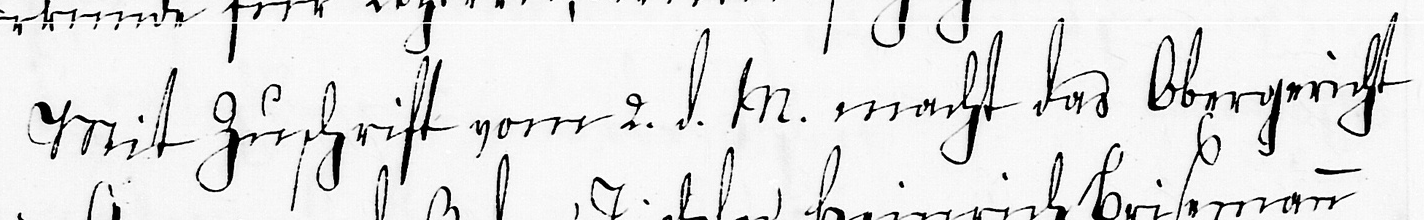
Mit Zuschrift vom 2. d. M. macht das Obergericht
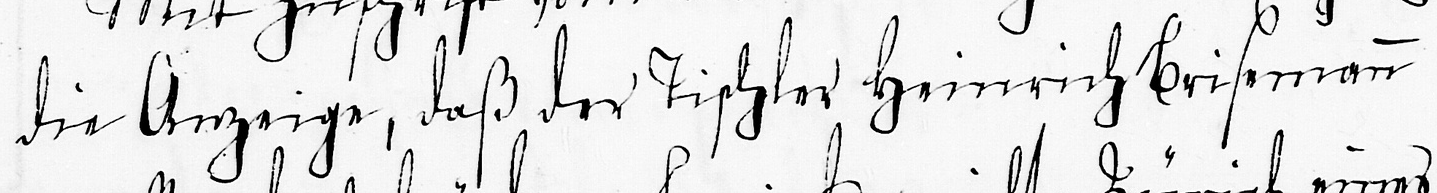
die Anzeige, daß der Tischler Heinrich Brisemann
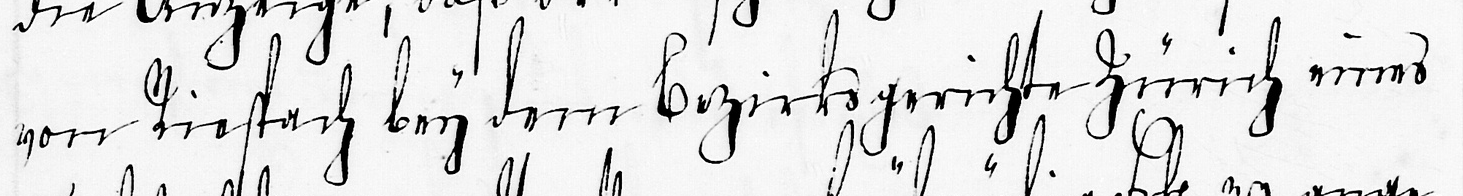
von Riespach bey dem Bezirksgerichte Zürich eines
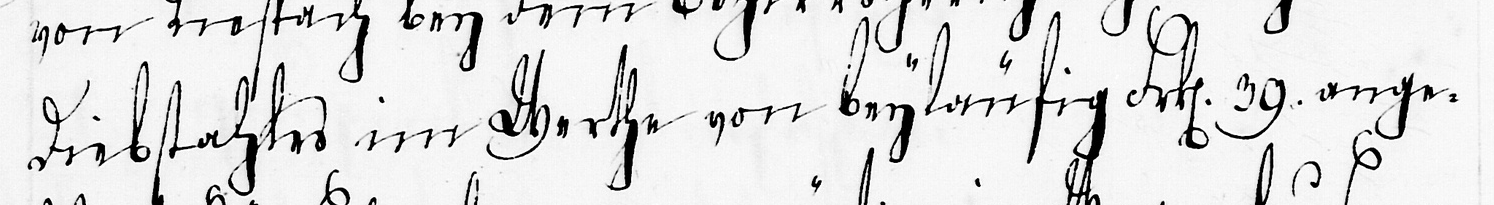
Diebstahles im Werthe von beyläufig Frk[en]. 39.
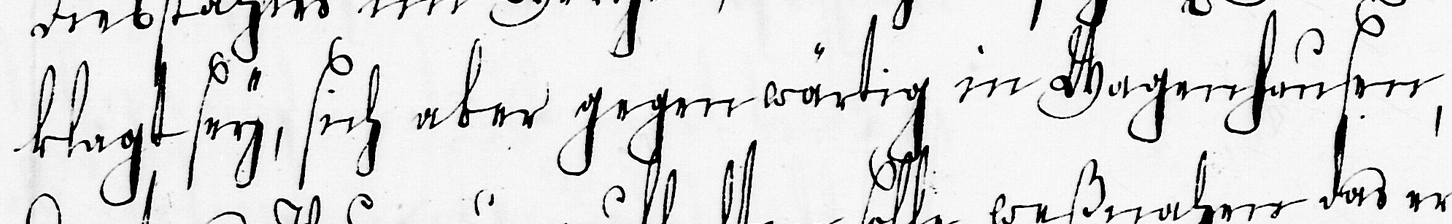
klagt sey, sich aber gegenwärtig in Wagenhausen,
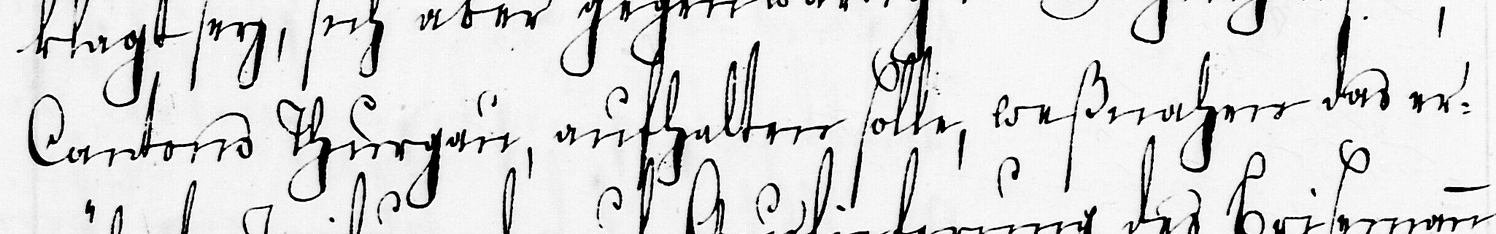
Cantons Thurgau, aufhalten solle, weßnahen das er¬
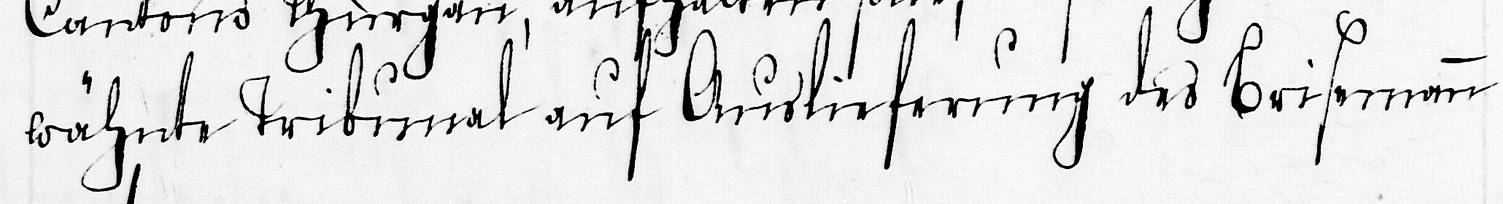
wähnte Tribunal auf Auslieferung des Brisemann
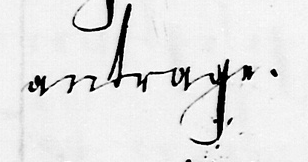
antrage.
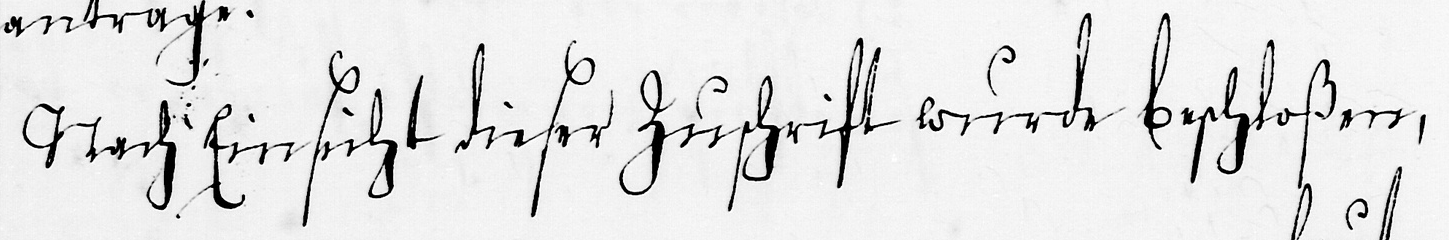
Nach Einsicht dieser Zuschrift wurde beschloßen,
